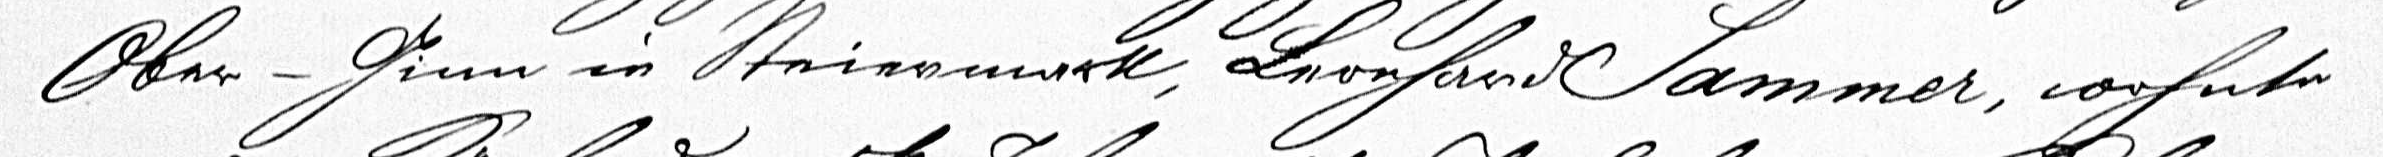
Ober-Ginn in Steiermark, Leonhard Sammer, wohnte
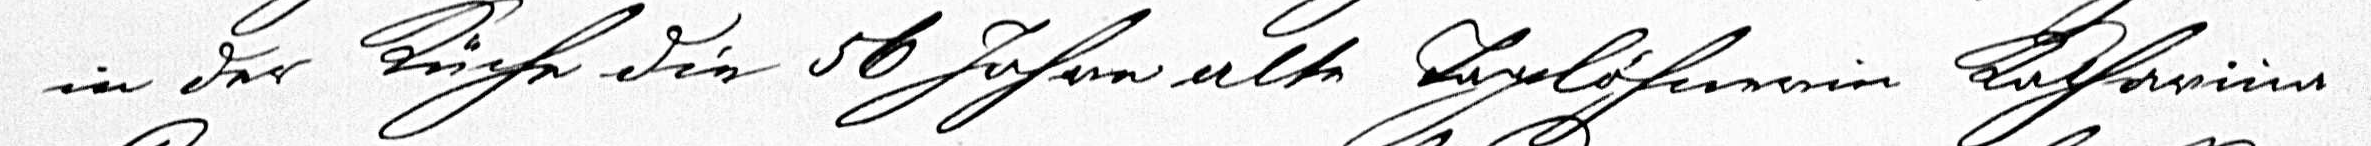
in der Küche die 56 Jahre alte Taglöhnerin Katharina
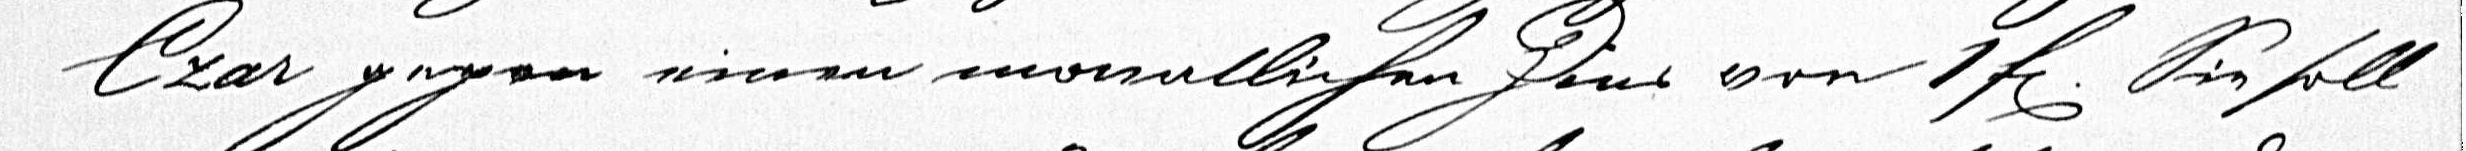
Czar gegen einen monatlichen Zins von 1 fl. Sie soll
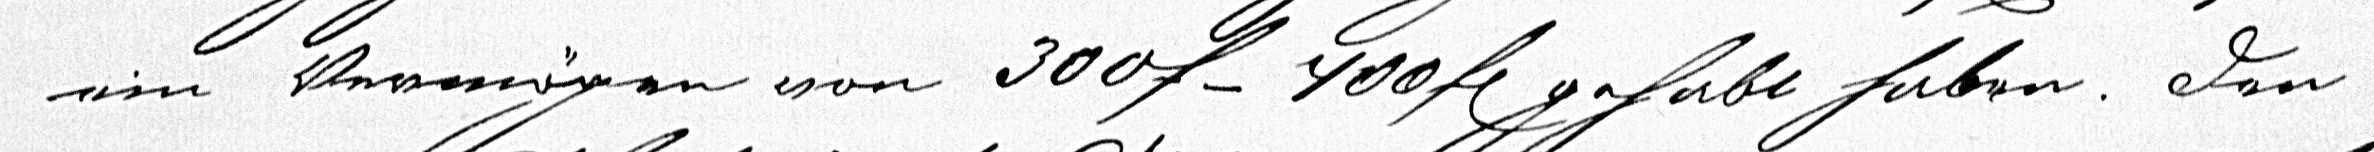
ein Vermögen von 300 f- 400 f gehabt haben. Den
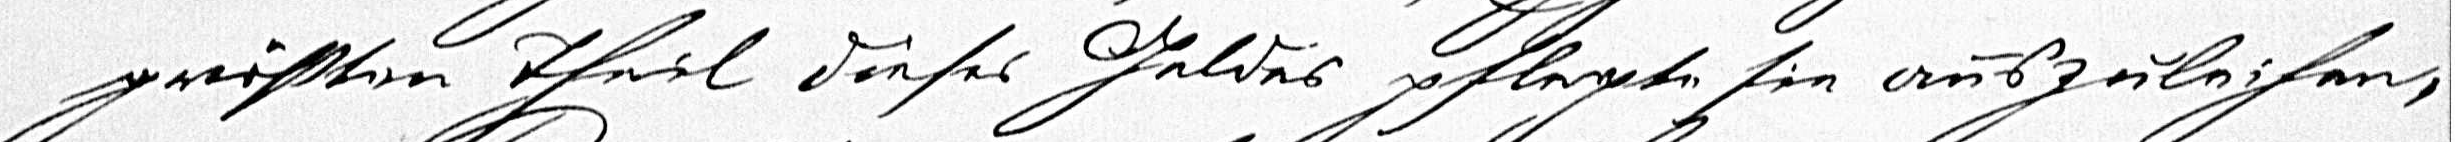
größten Theil deses Geldes pflegte sie auszuleihen,
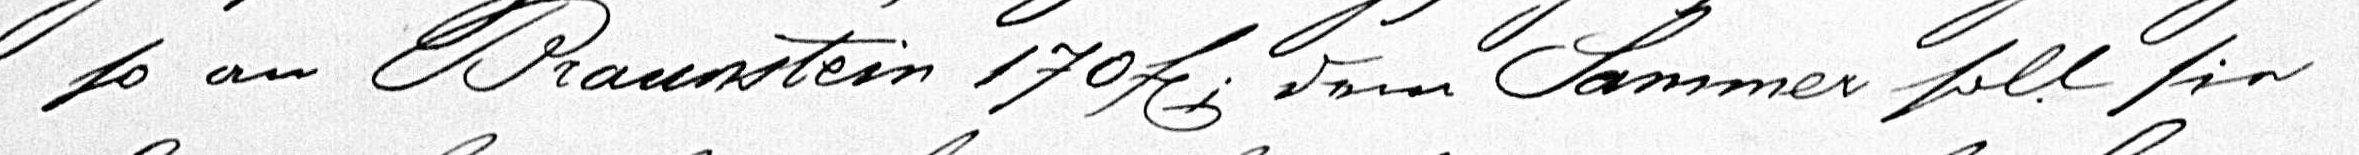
so an Braunstein 170fl; dem Sammer soll sie
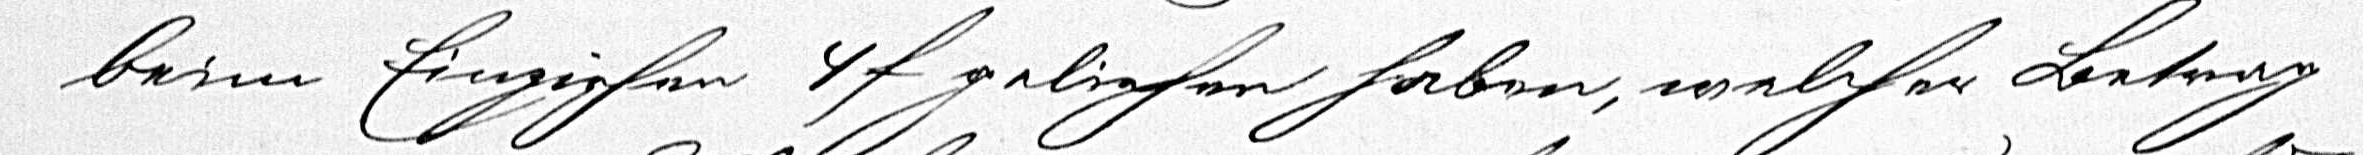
beim Einziehen 4f geliehen haben, welcher Betrag
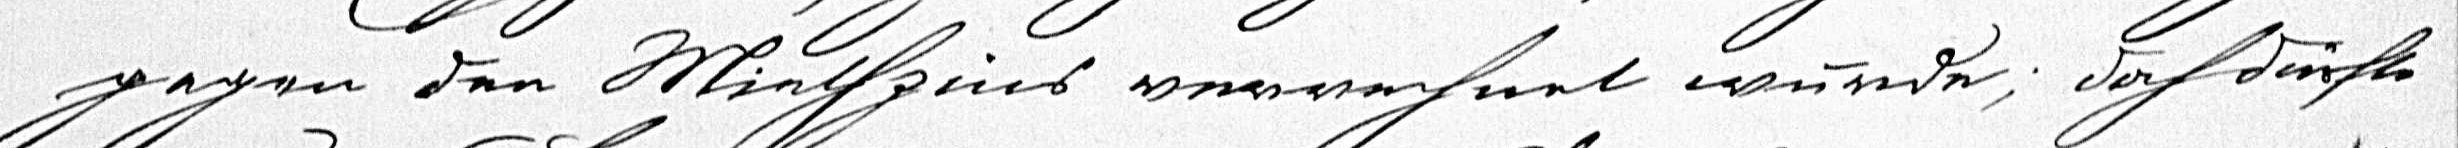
gegen den Miethzins verrechnet wurde; doch dürfte
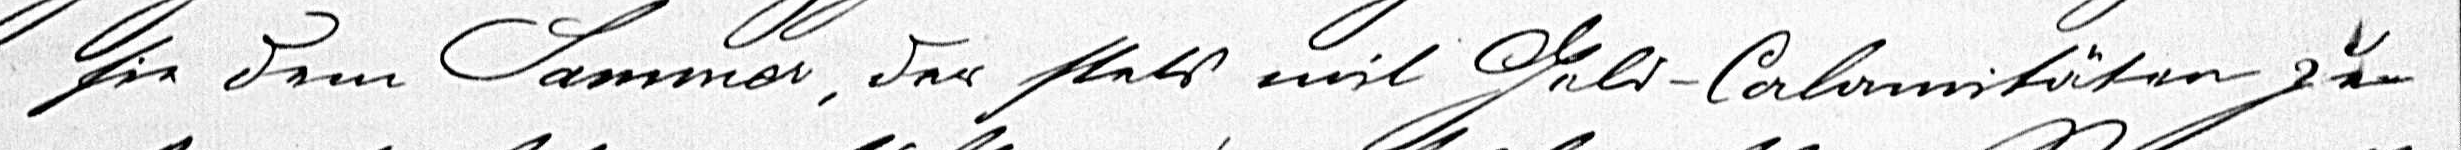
sie dem Sammer, der stets mit Geld-Calamitäten zu
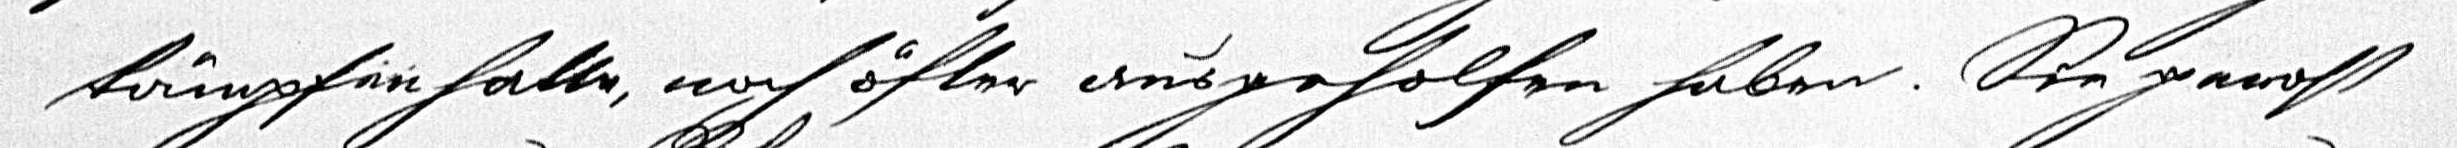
kämpfen hatte, noch öfter ausgeholfen haben. Sie genoss
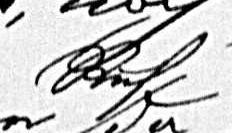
Ruf
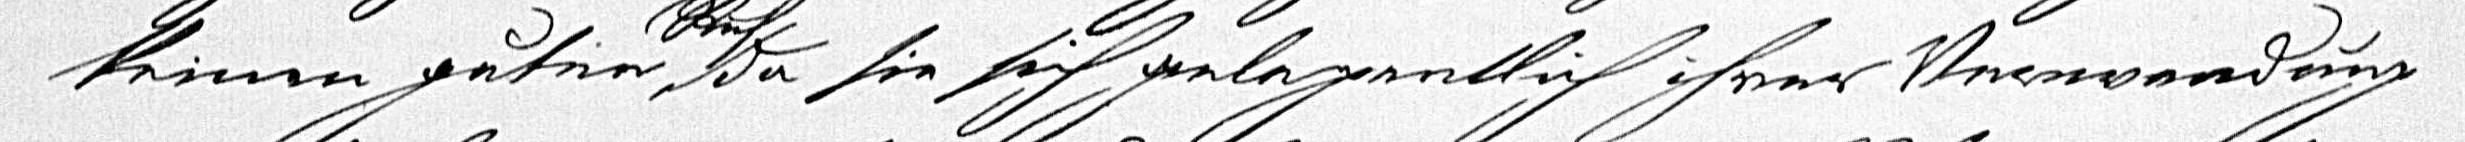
keinen guten, da sie sich gelegentlich ihrer Verwendung
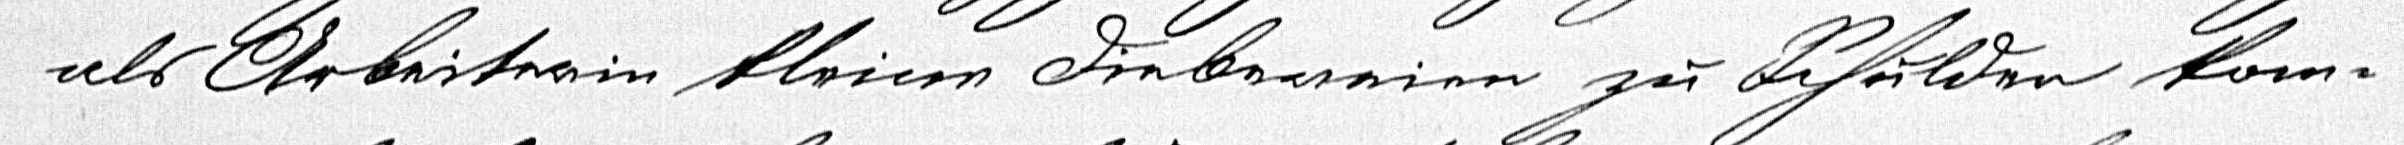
als Arbeiterin kleine Diebereien zu Schulden kom¬
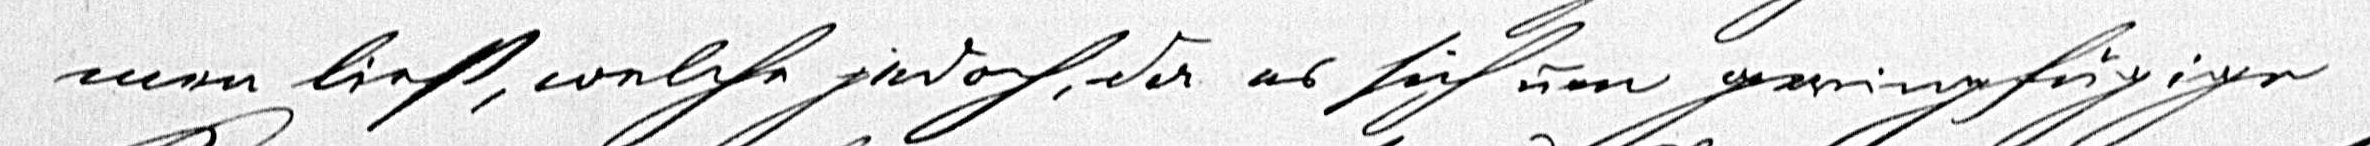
men ließ, welche jedoch, da es sich um geringfügige
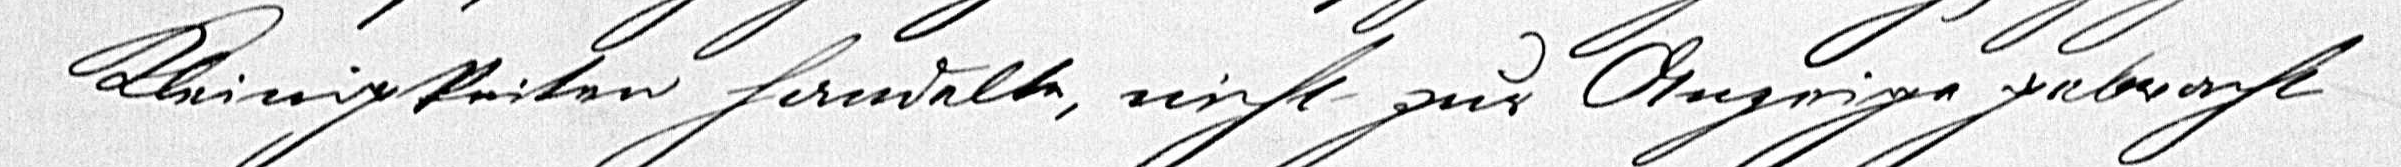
Kleinigkeiten handelte, nicht zur Anzeige gebracht
